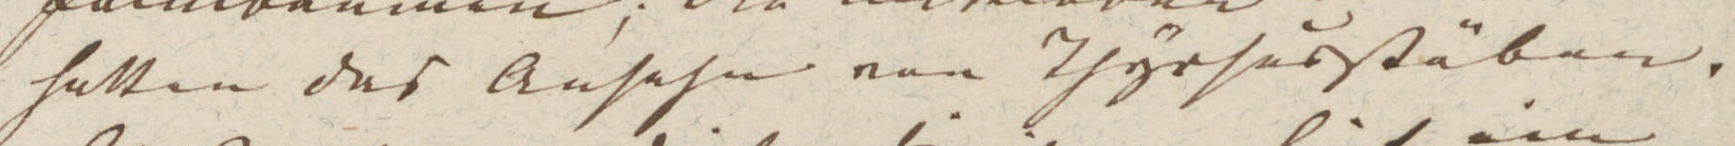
hatten das Ansehn von Thyrsusstäben.
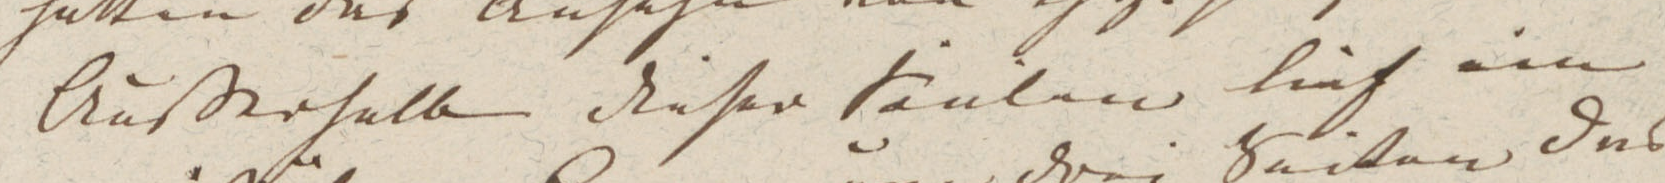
Ausserhalb dieser Säulen lief ein
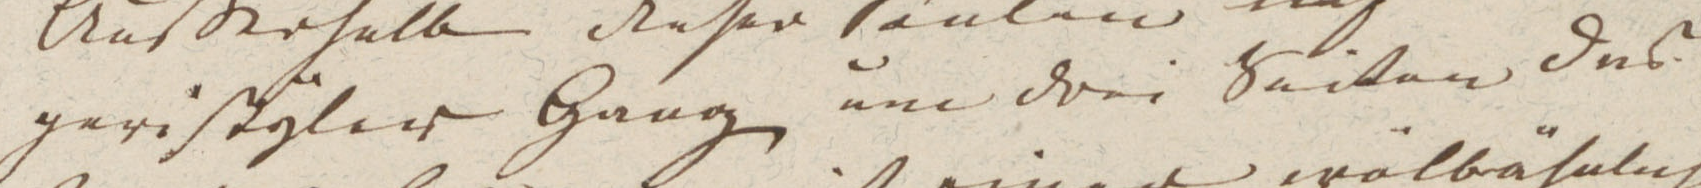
peristyler Gang um drei Seiten des
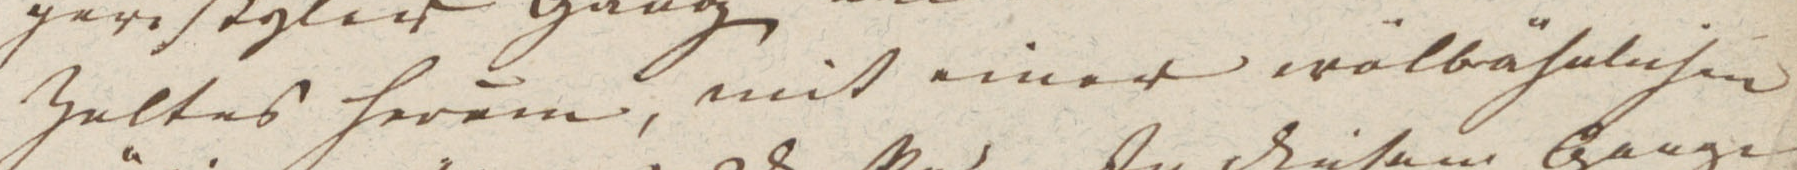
Zeltes herum, mit einer wölbähnlichen
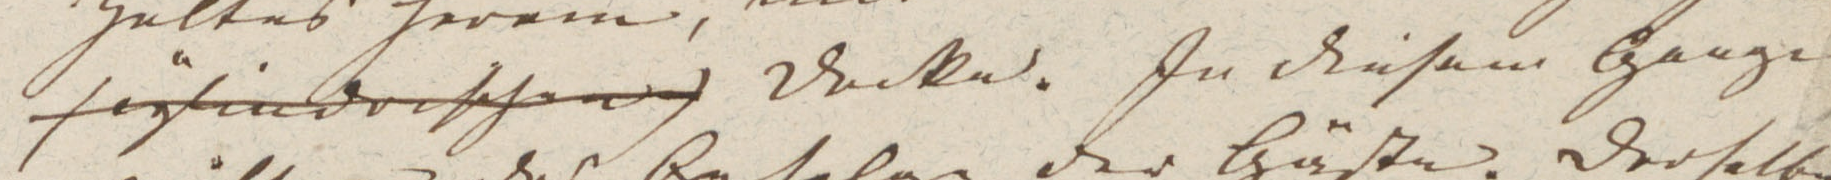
(cylindrischen) Decke. In diesem Gange
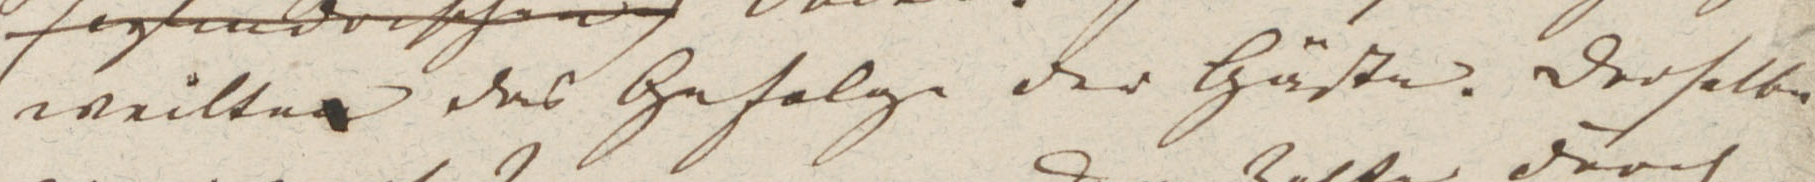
weilten das Gefolge der Gäste. Derselbe
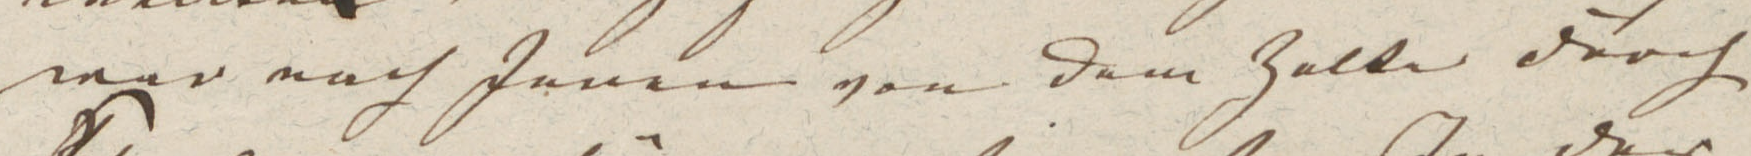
war nach Innen von dem Zelte durch
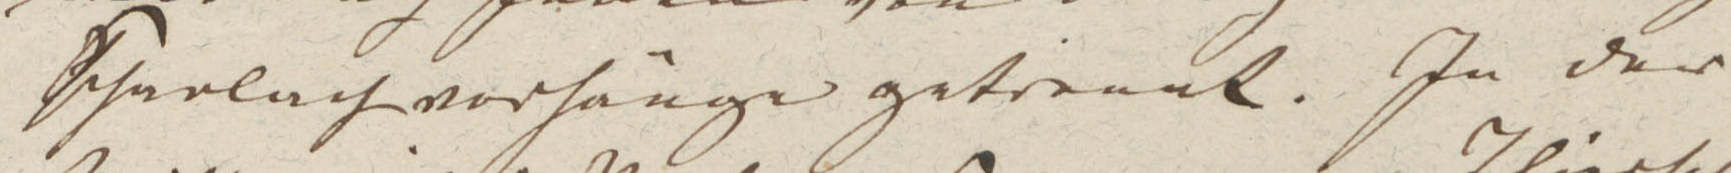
sScharlachvorhänge getrennt. In der
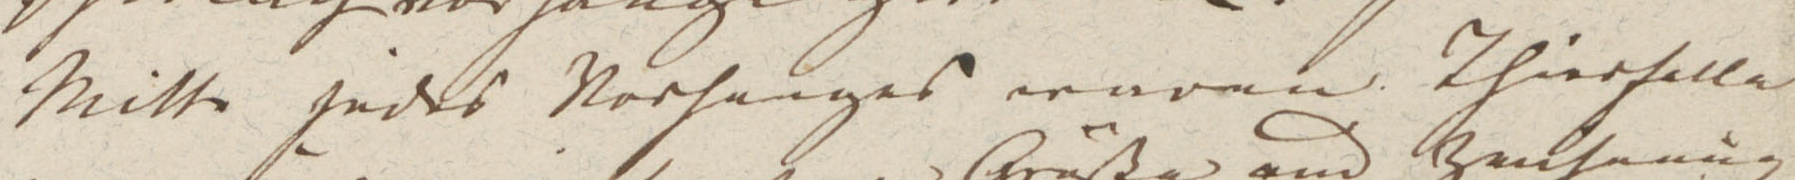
Mitte jedes Vorhanges waren Thierfelle
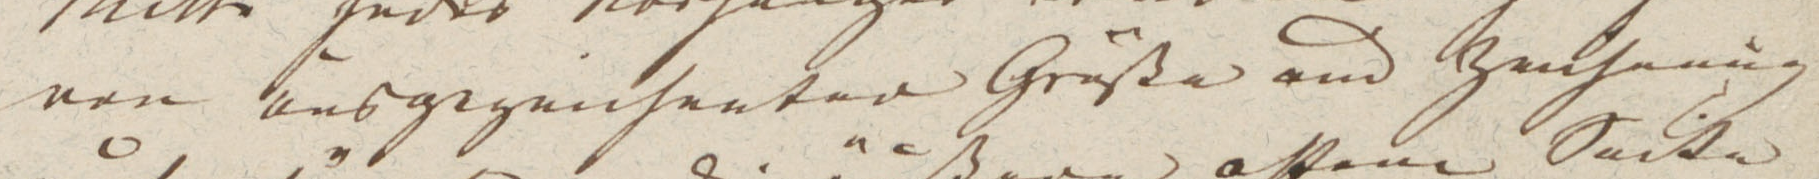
von ausgezeichneter Grösse und Zeichnung
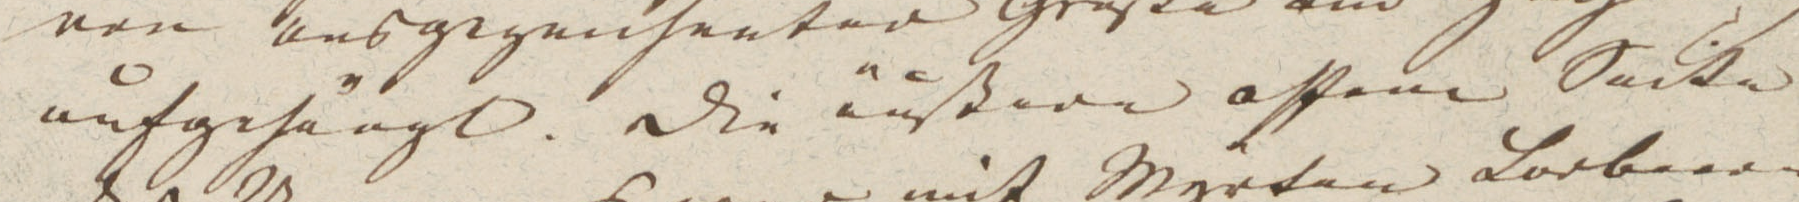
aufgehängt. Die äussere offene Seite
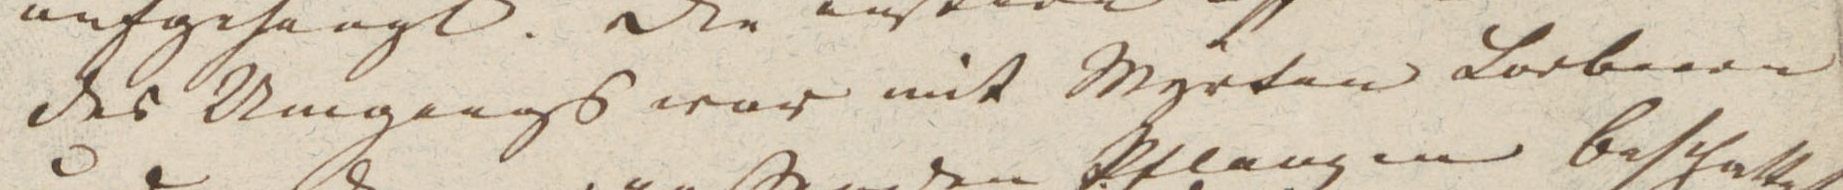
des Umgangs war mit Myrten Lorbeern
